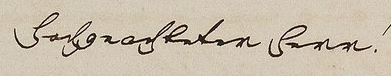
Hochgeachteter Herr!
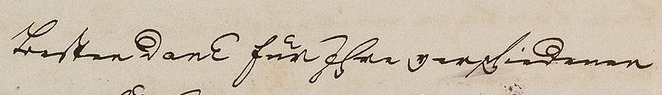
Besten Dank für Ihre verschiedenen
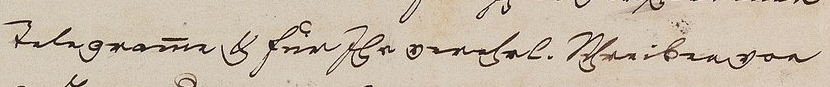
Telegramme & für Ihr verehrl. Schreiben von
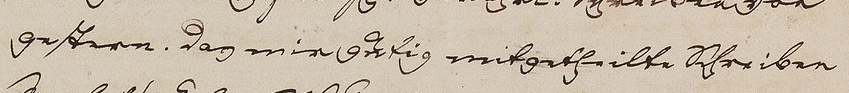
gestern. Das mir gütig mitgetheilte Schreiben
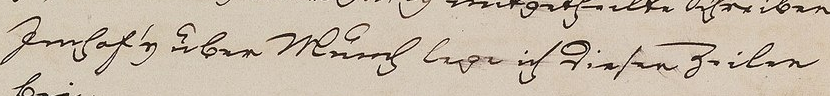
Imhof's über Munch lege ich diesen Zeilen
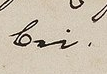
bei.
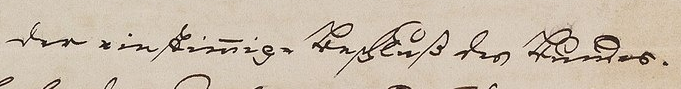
Der einstimmige Beschluß des Bundes-
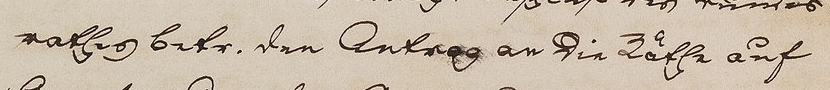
rathes betr. den Antrag an die Räthe auf
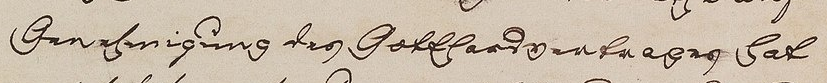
Genehmigung des Gotthardvertrages hat
